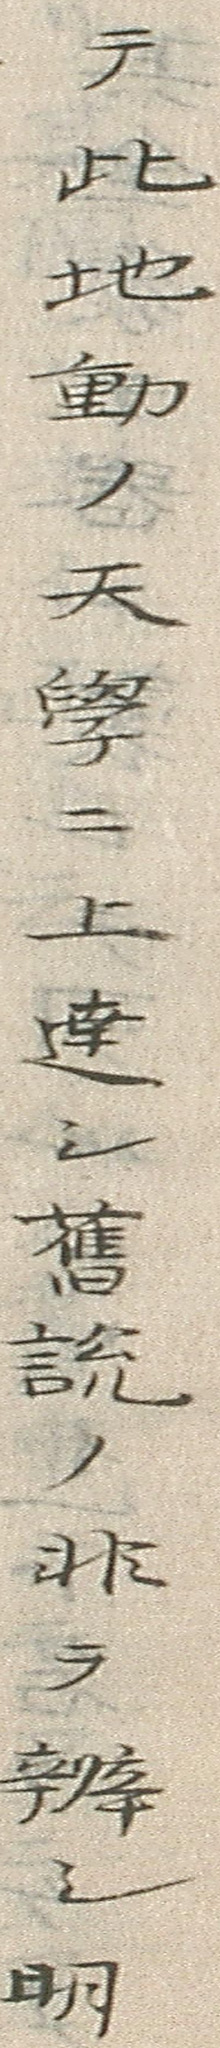テ此地動ノ天学ニ上達シ旧説ノ非ヲ弁シ明
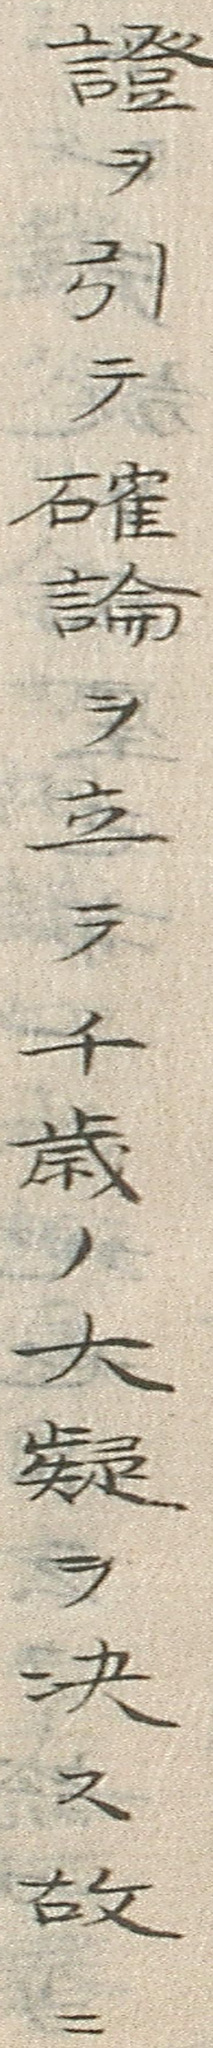証ヲ引テ確論ヲ立テ千歳ノ大疑ヲ決ス故ニ
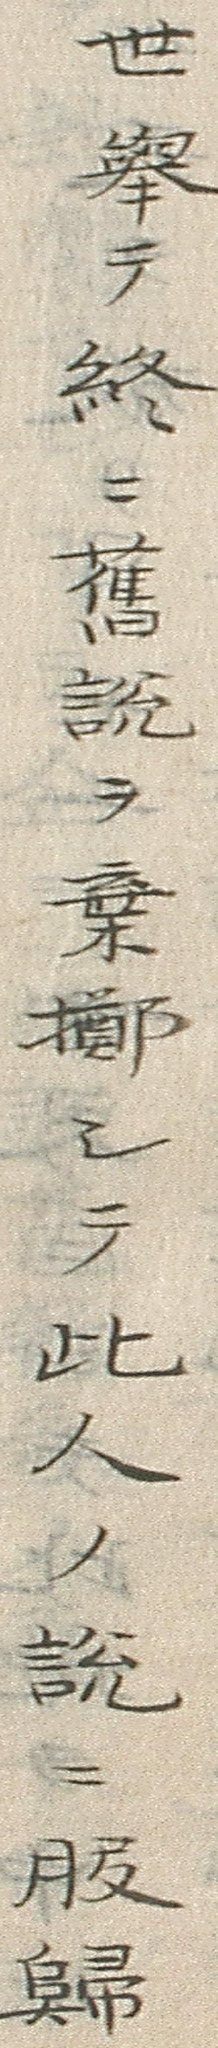世挙テ終ニ旧説ヲ棄擲シテ此人ノ説ニ服帰
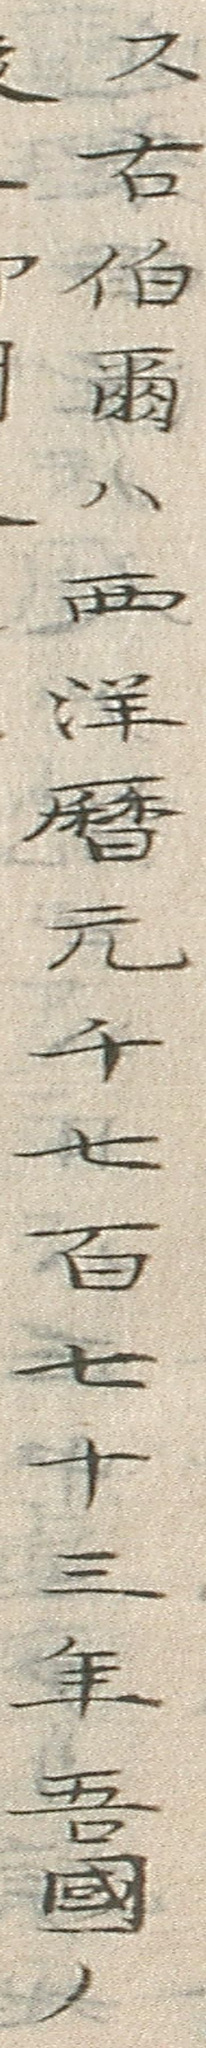ス古伯爾ハ西洋暦元千七百七十三年吾国ノ
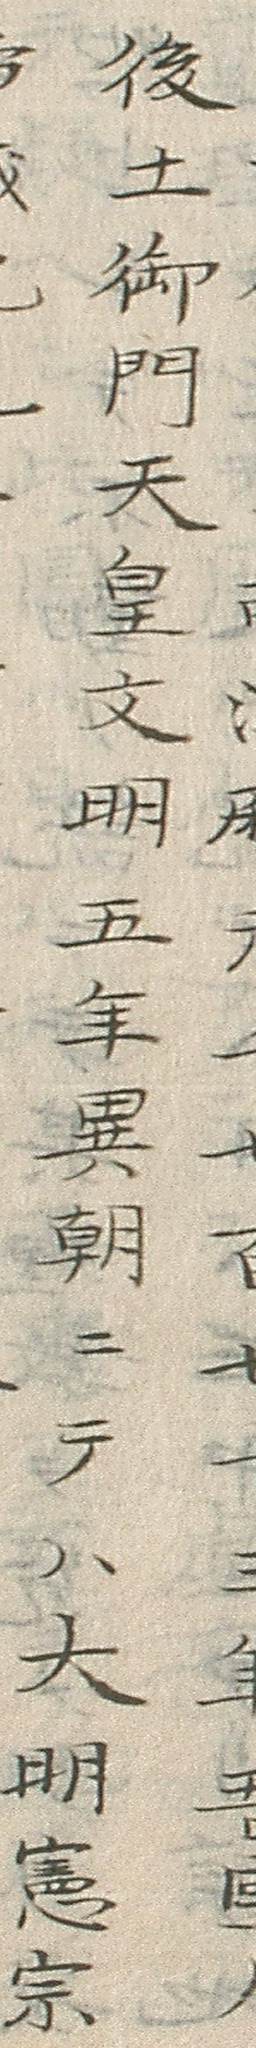後土御門天皇文明五年異朝ニテハ大明憲宗
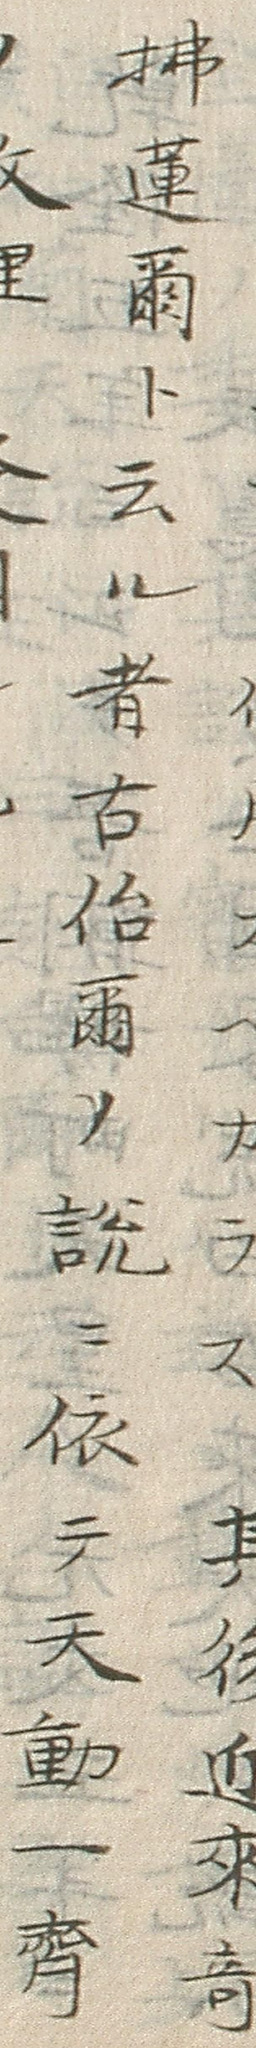払蓮爾ト云ル者古伯爾ノ説ニ依テ天動一斉
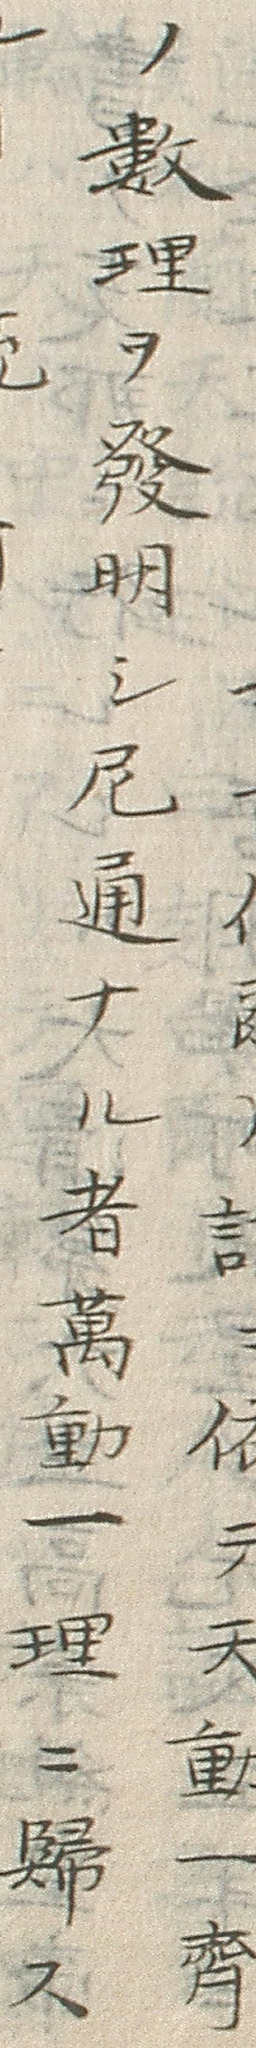ノ数理ヲ発明シ尼通ナル者万動一理ニ帰ス
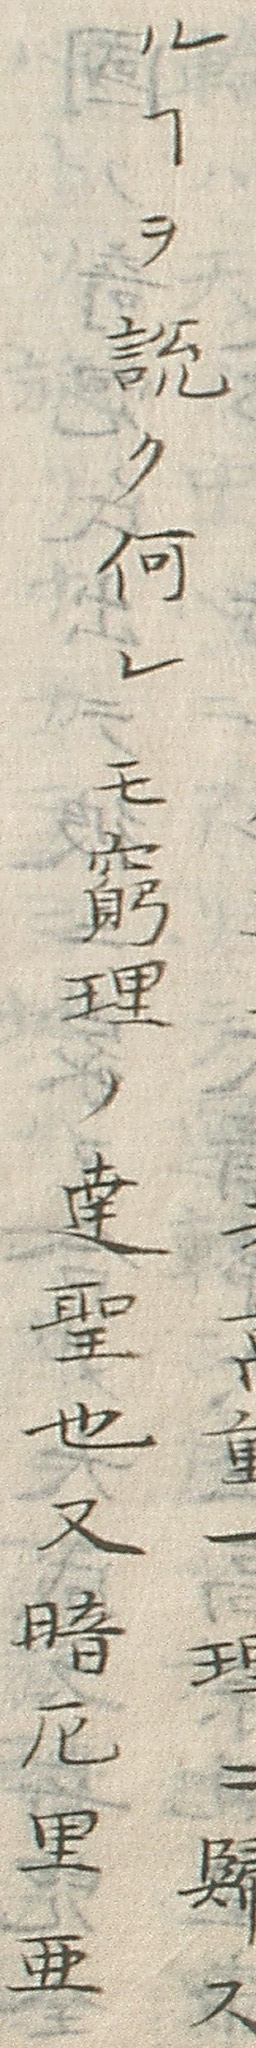ルコトヲ説ク何レモ窮理ノ達聖也又暗厄里亜

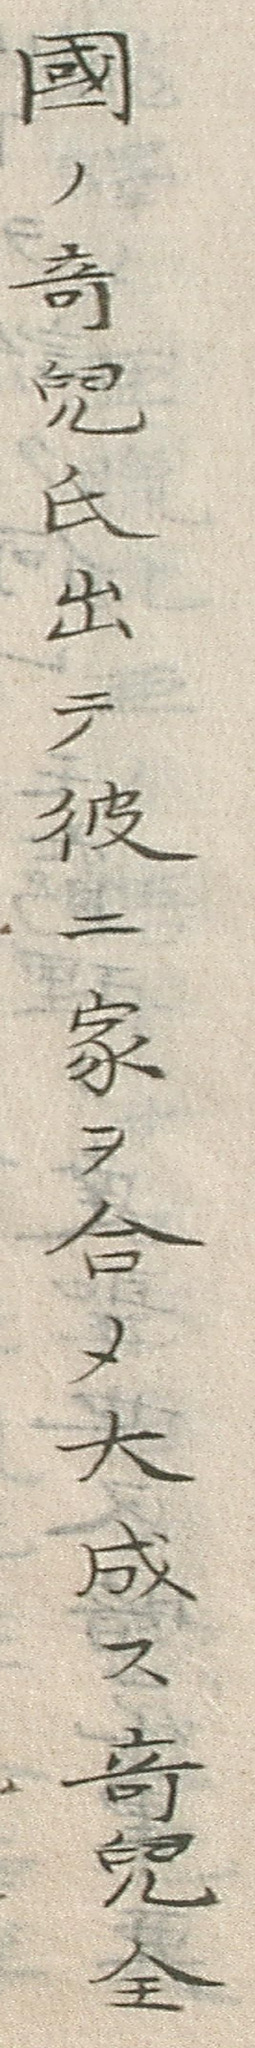国ノ奇児氏出テ彼ニ家ヲ合シテ大成ス奇児全
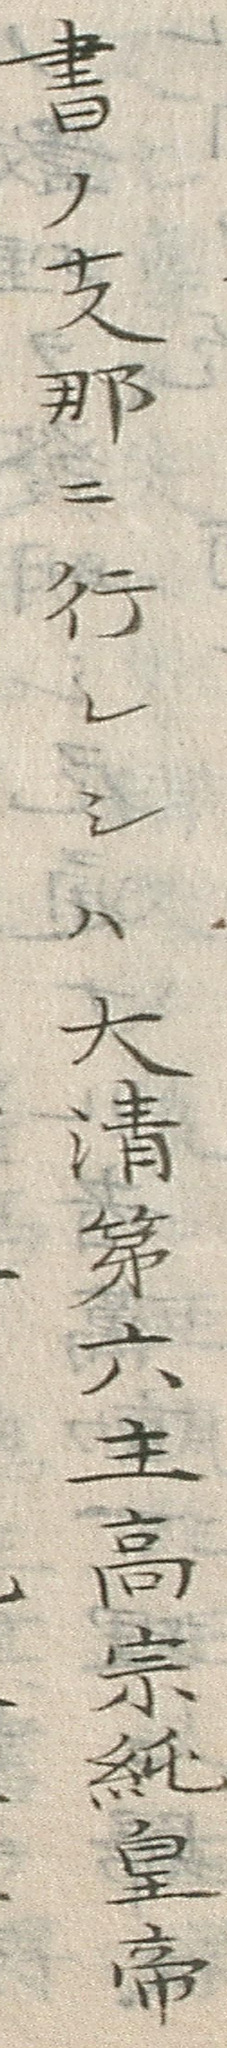書ノ支那ニ行レシハ大清第六主高宗純皇帝
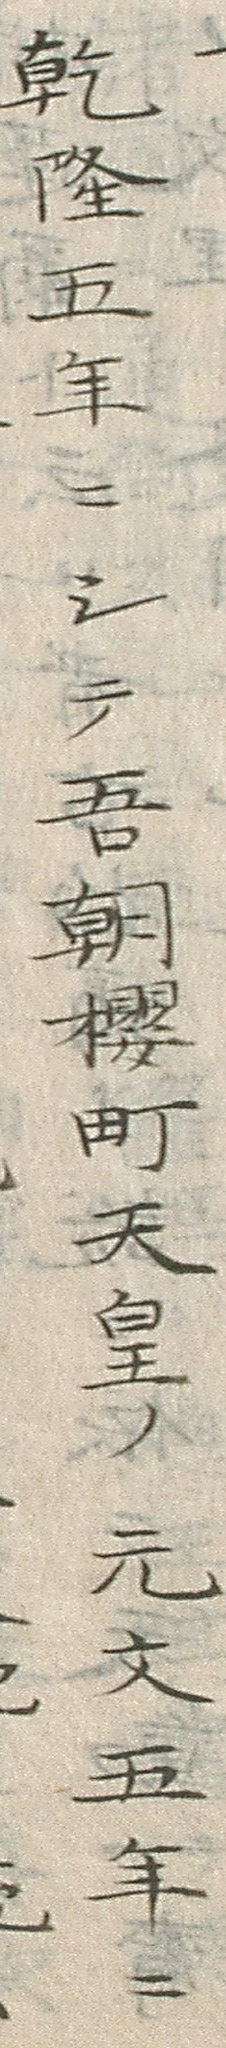乾隆五年ニシテ我吾朝桜町天皇ノ元文五年ニ
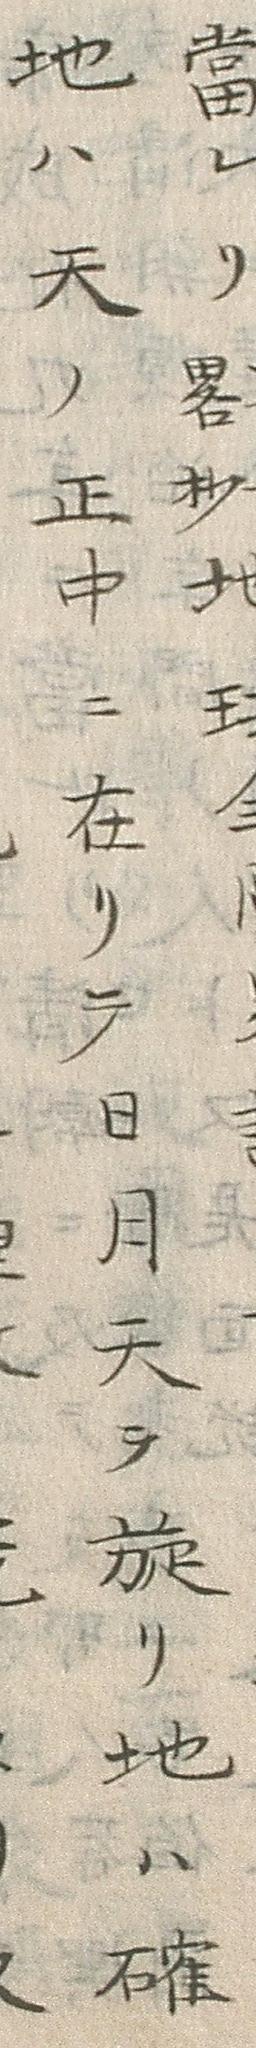地ハ天ノ正中ニ在リテ日月天ヲ旋リ地ハ確
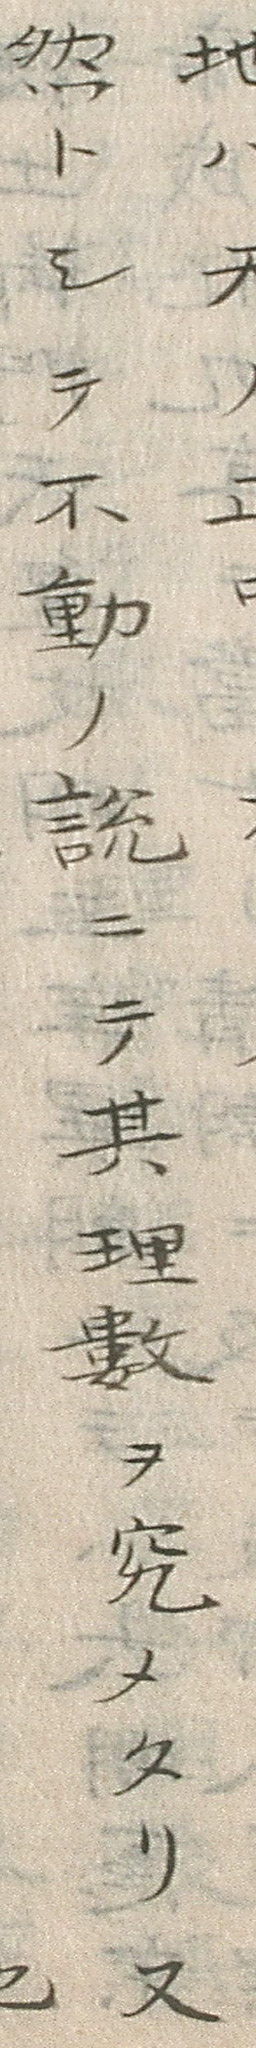然トシテ不動ノ説ニテ其理数ヲ究メタリ又
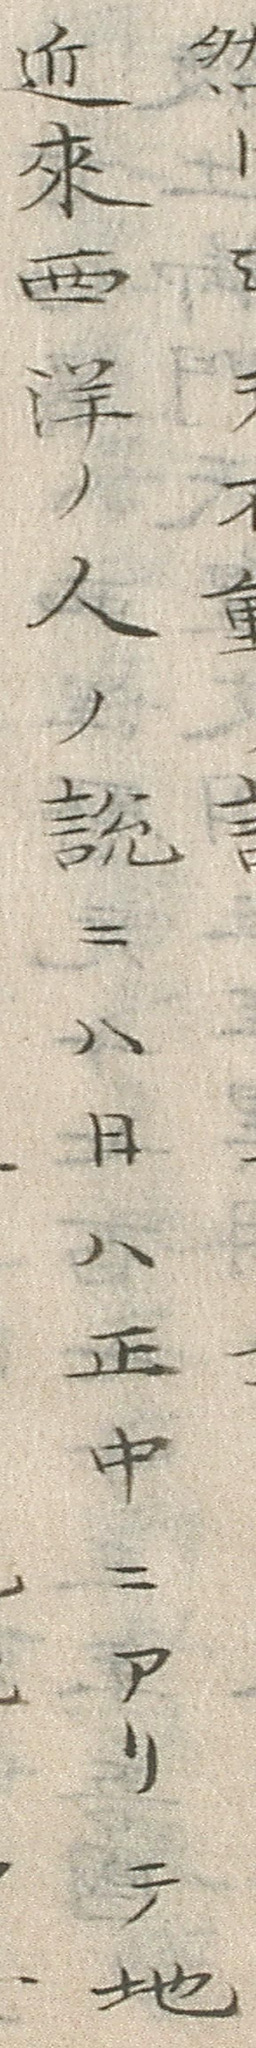近来西洋ノ人ノ説ニハ日ハ正中ニアリテ地
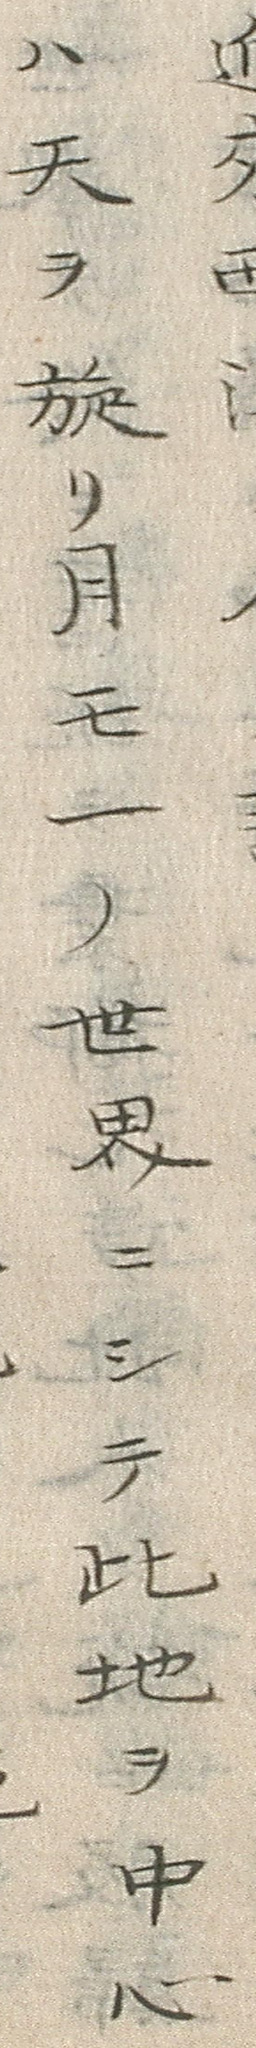ハ天ヲ旋リ月モ一ノ世界ニシテ此地ヲ中心
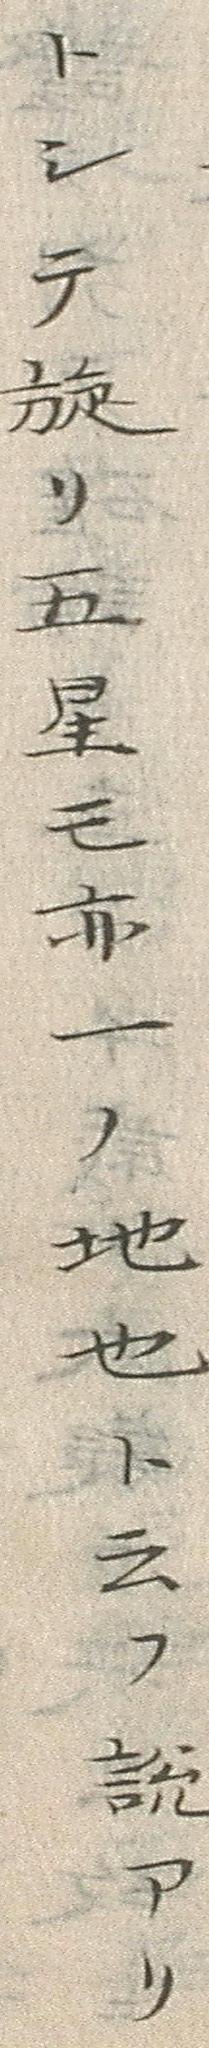トシテ旋リ五星モ亦一ノ地也ト云フ説アリ
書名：天學略名目羽翼　全
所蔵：東京大学地震研究所図書室 Earthquake Research Institute Library, The University of Tokyo, JAPAN
